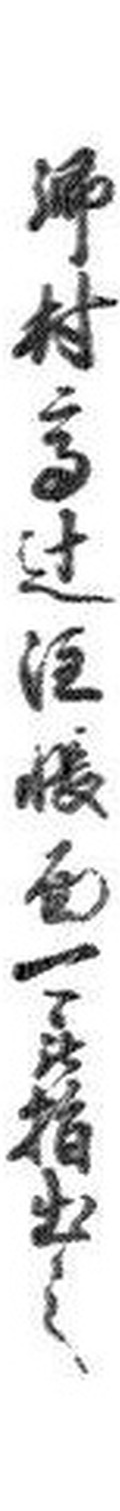郷村高辻注帳面可被指出之
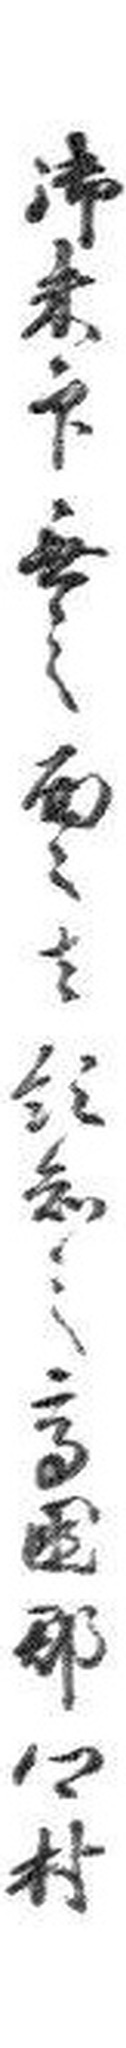御朱印無之面々者領知之高国郡郷村
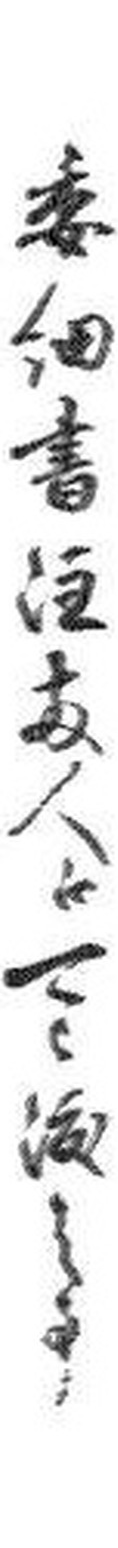委細書注両人江可被渡之事
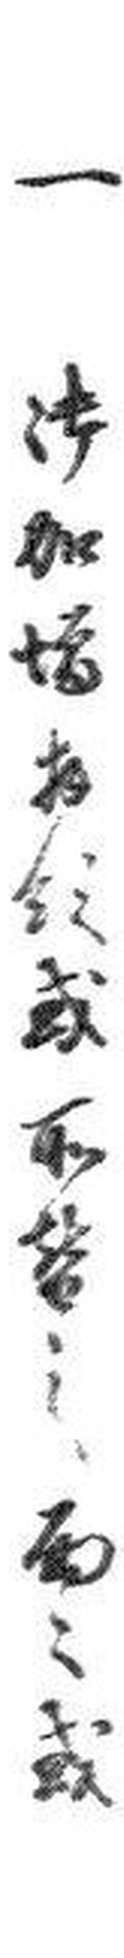一御加増拝領或取替之面々或
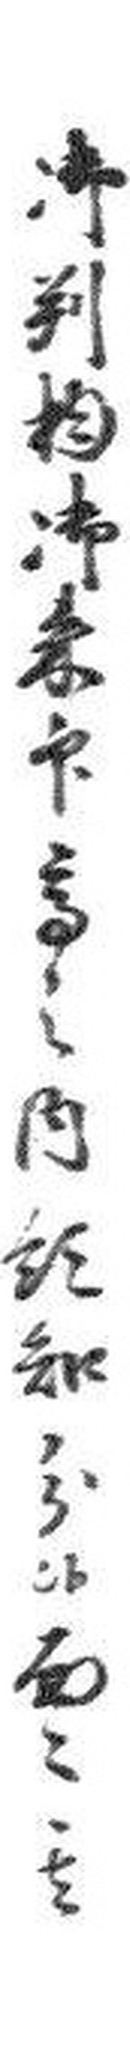御判物御朱印高之内領知分候面々者其
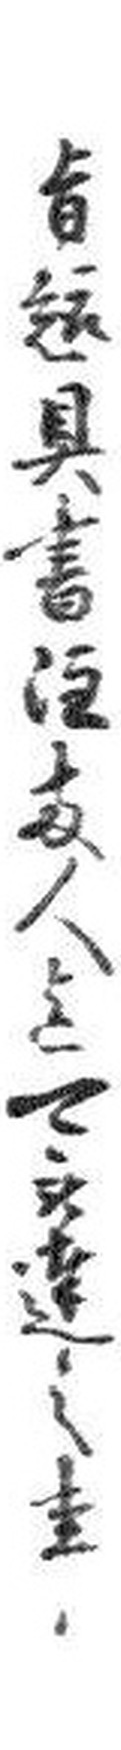旨趣具書注両人迄可被達之事
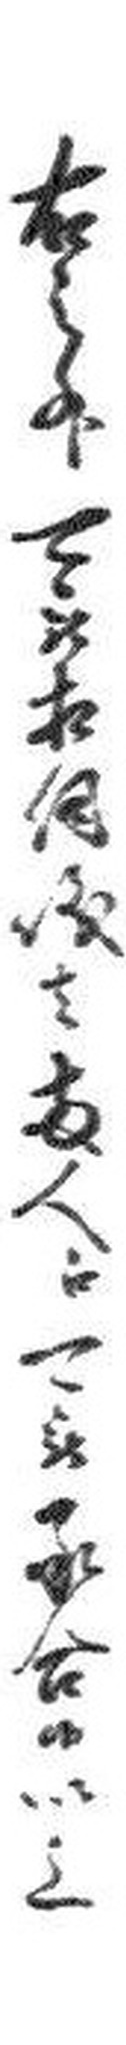右之外可被相伺儀者両人江可被承合候以上
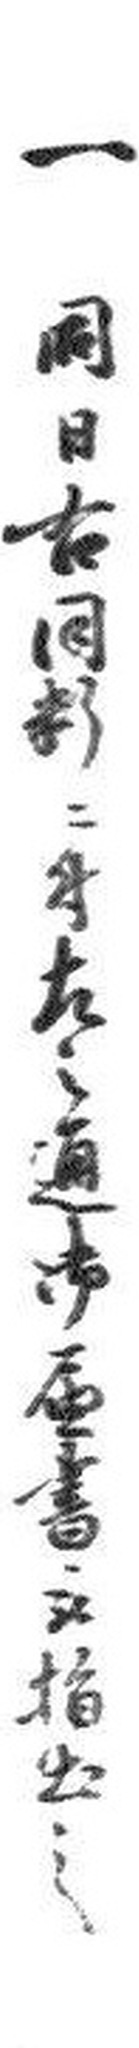一同日右同断ニ付左之通御届書被指出之

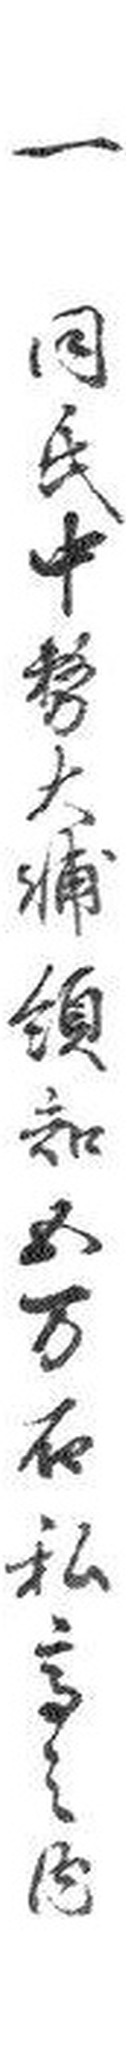一同氏中務大輔領知五万石私高之内
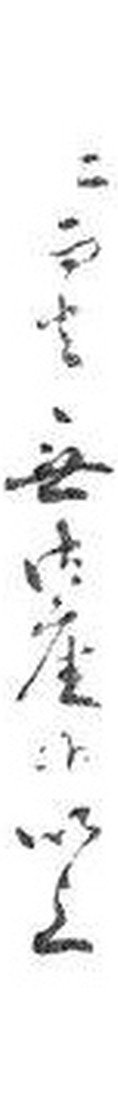ニ而者無御座候以上
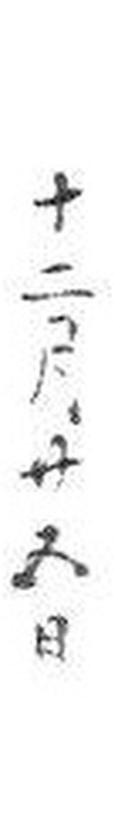十二月廿五日
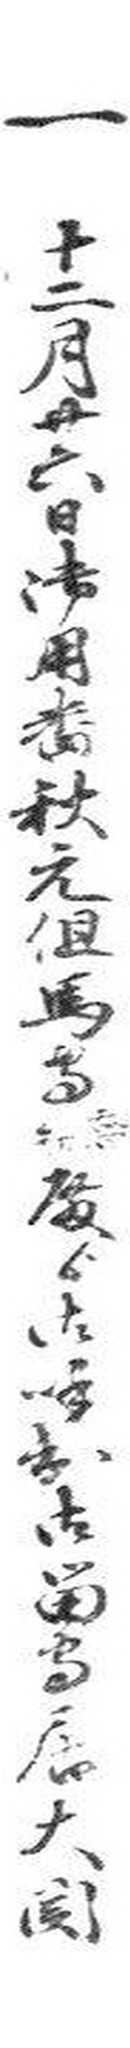一十二月廿六日御用番秋元但馬守喬知殿ゟ御呼出御留守居大関
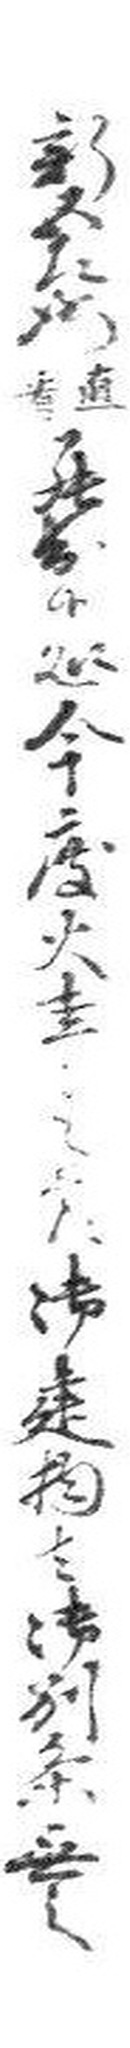新五左衛門直看罷出候処今度火事之節御建物者御別条無之
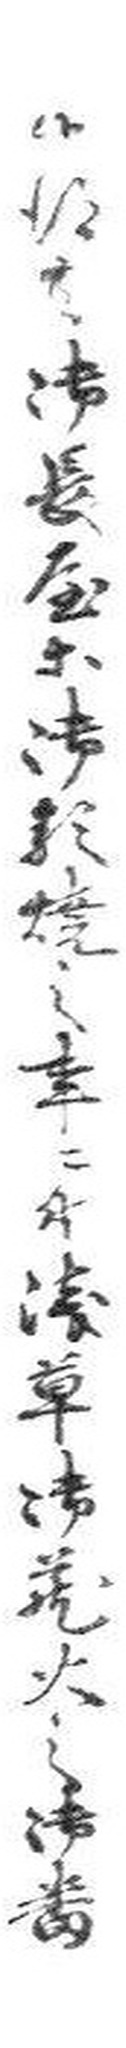候得共御長屋等御類焼之事ニ付浅草御蔵火之御番
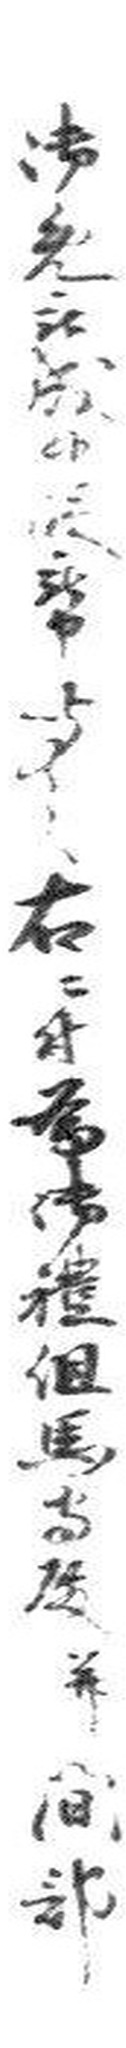御免被成候段被申聞之右ニ付為御礼但馬守殿并間部
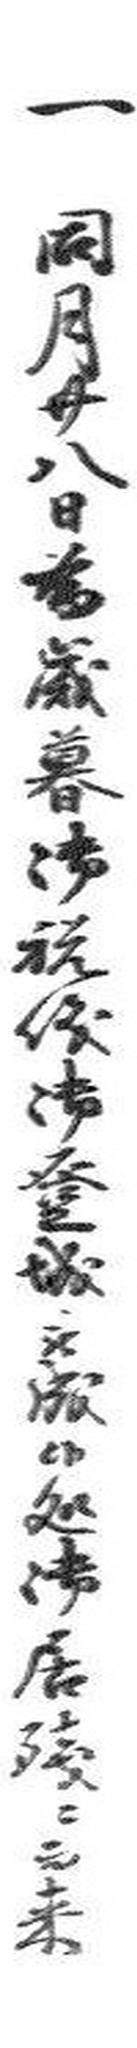一同月廿八日為歳暮御祝儀御登城被成候処御居残ニ而来
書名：家譜 二十八 吉邦公 従宝永七年七月五日到正徳元年十二月
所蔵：福井県文書館 Fukui Prefectural Archives
